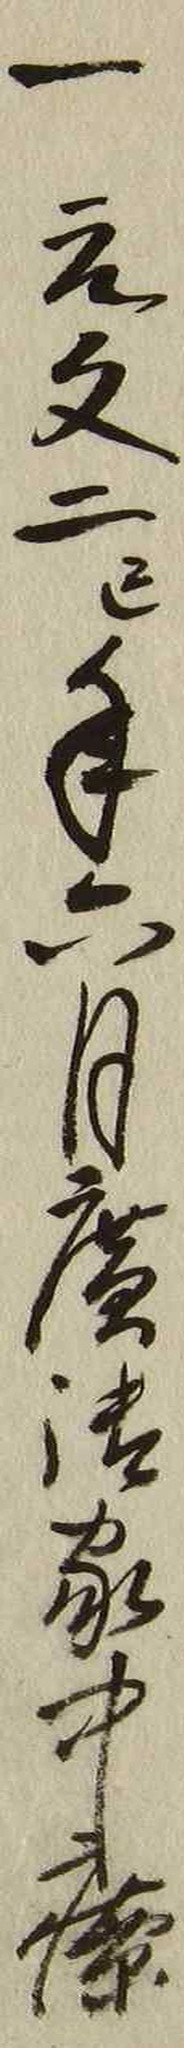一元文二巳年六月広御家中療
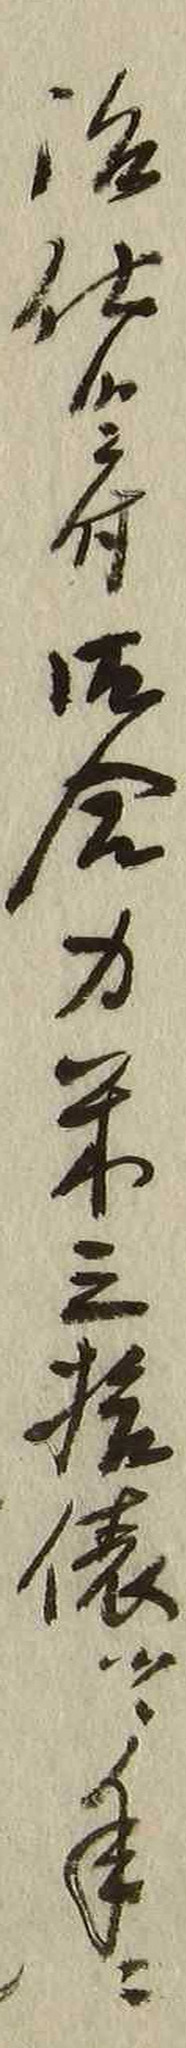治仕候ニ付御合力米三拾俵ツヽ年ニ
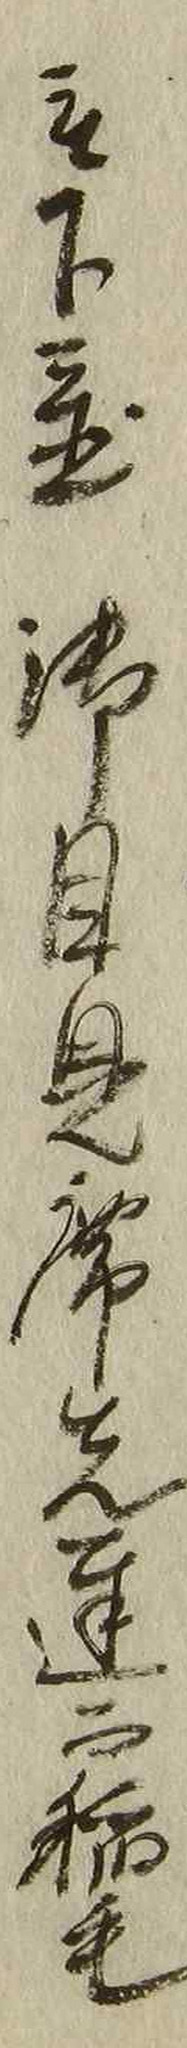被下置御目見席先達而稲毛
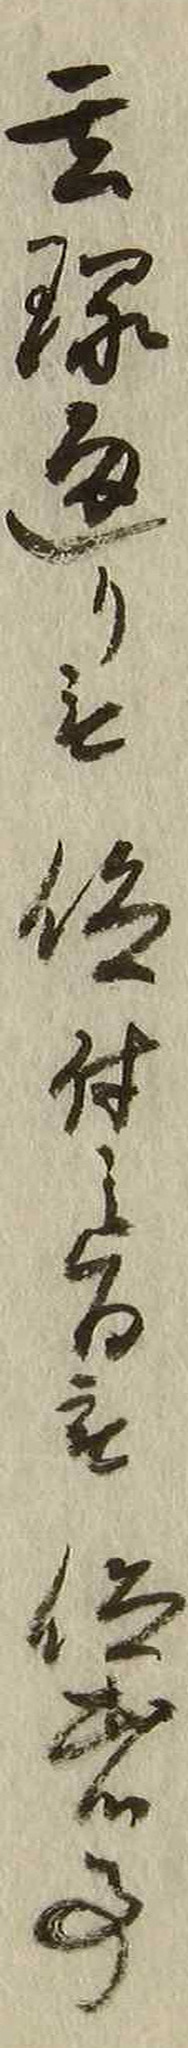玄録通り被仰付之旨被仰出候事
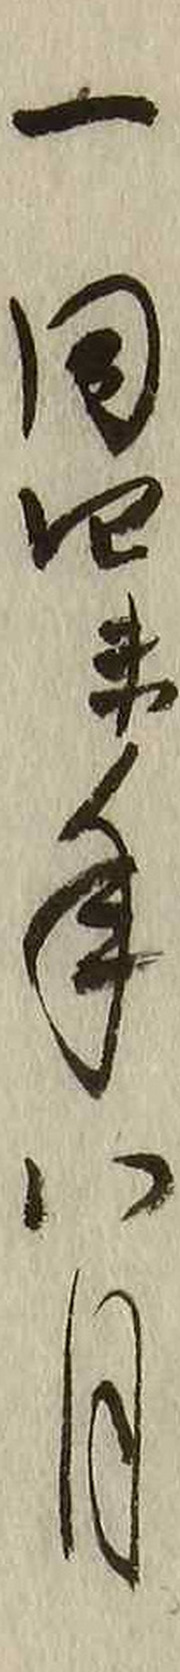一同四未年八月
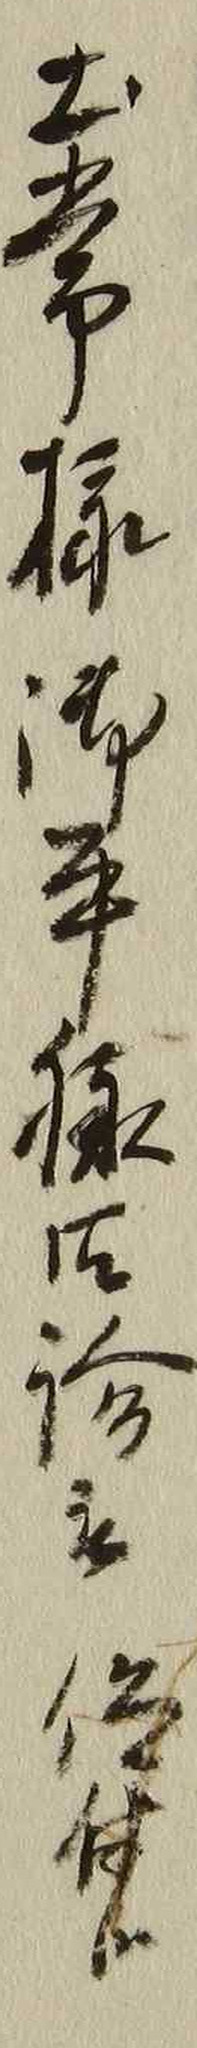土常様御平脈御診被仰付候
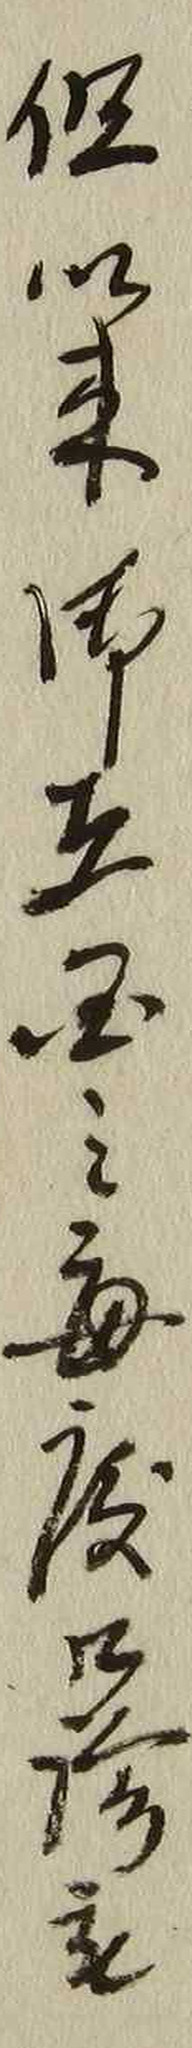但以来御在国之毎度御診被
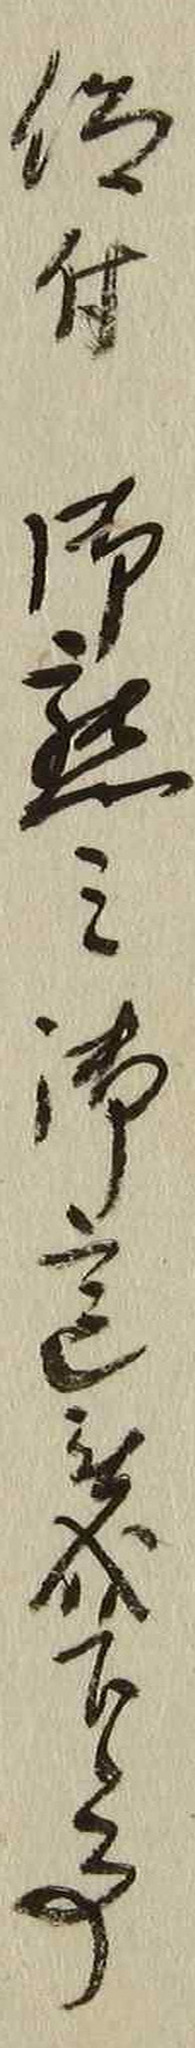仰付御懇之御意被成下候事
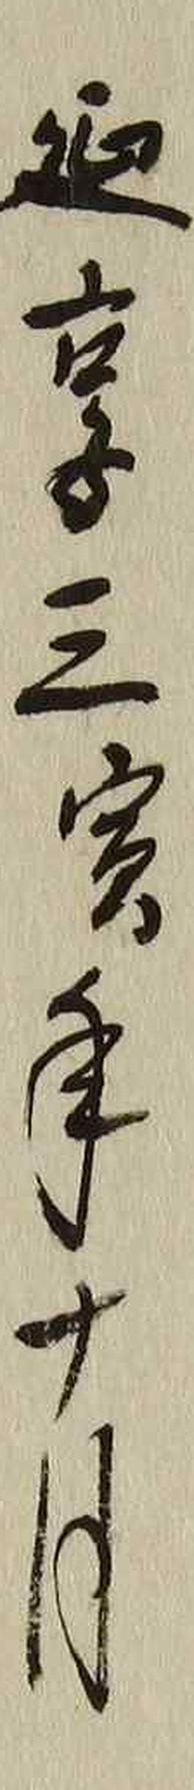延享三寅年十月
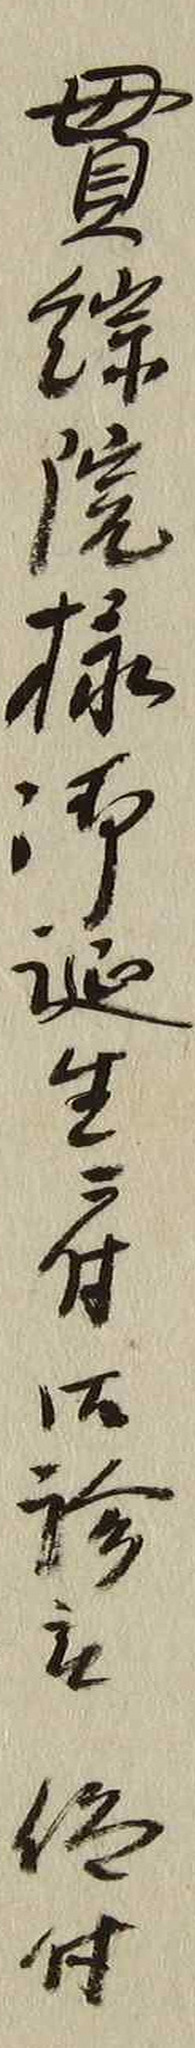貫綜院様御誕生ニ付御診被仰付
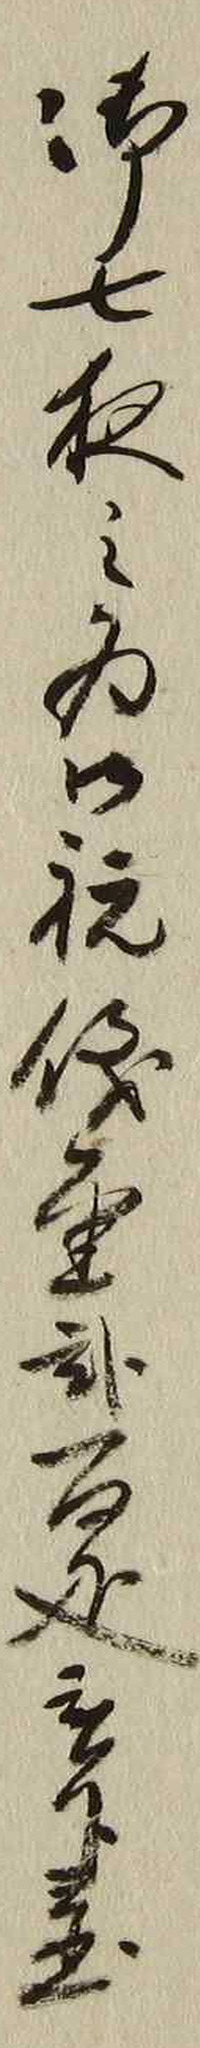御七夜之為御祝儀金弐百疋被下置
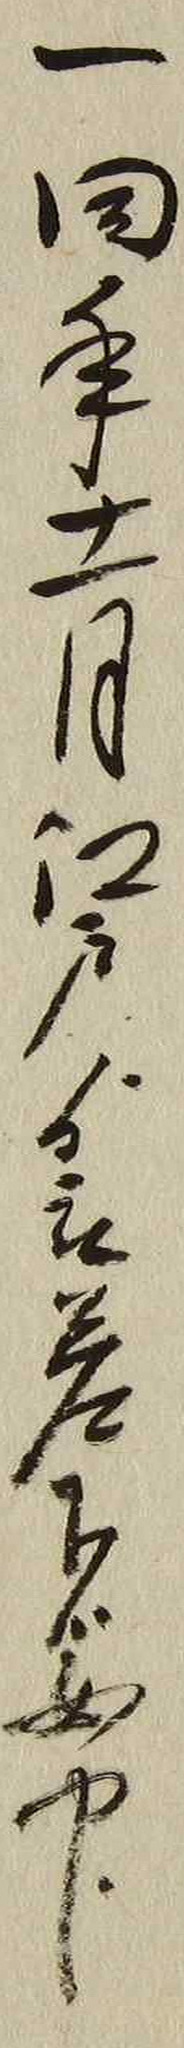一同年十一月江戸ゟ被差下候女中
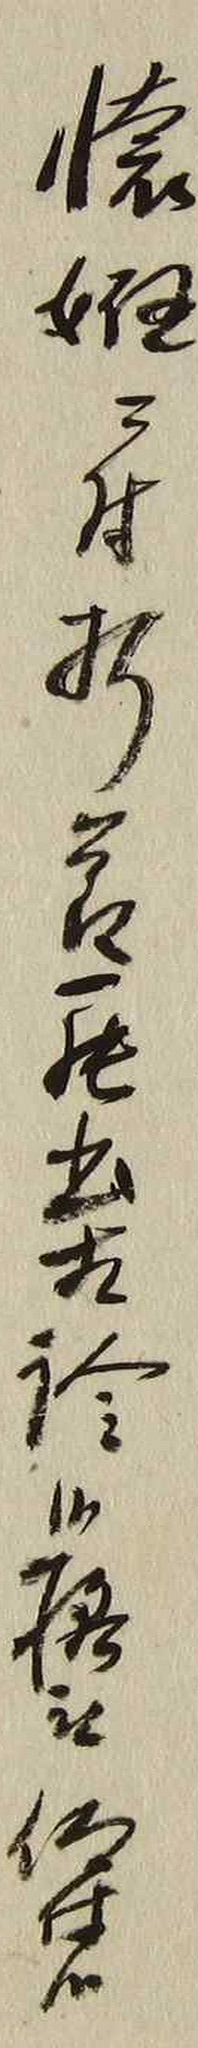懐妊ニ付折節罷出相診候様被仰付候
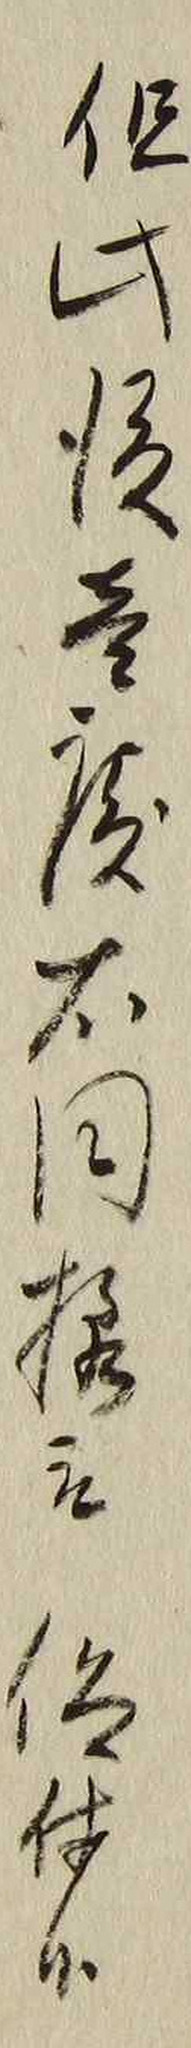但此後壱度右同様被仰付候
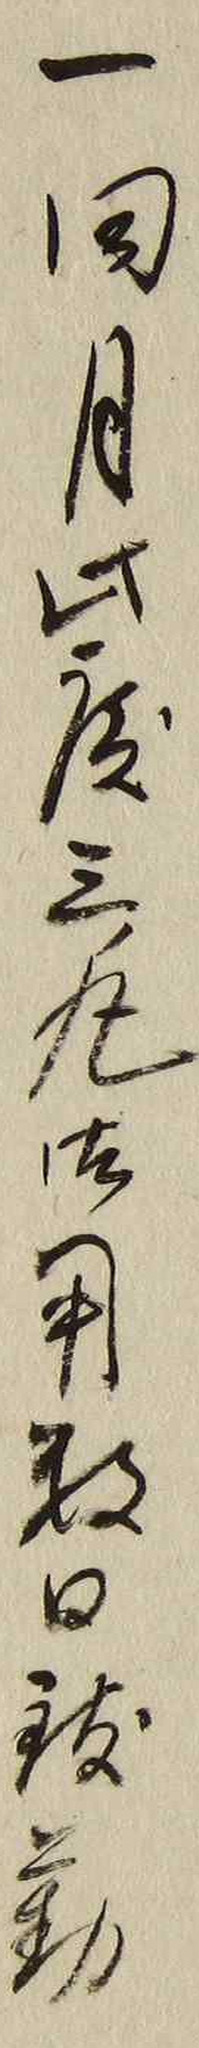一同月此度三ノ丸御用数日致勤
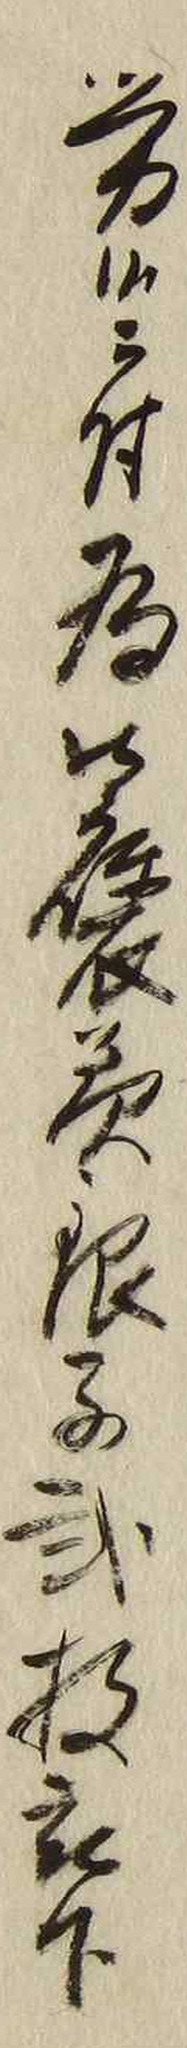労候ニ付為御褒美銀子弐枚被下
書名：諸士系譜　巻之353　す之部3
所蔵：会津若松市立会津図書館
